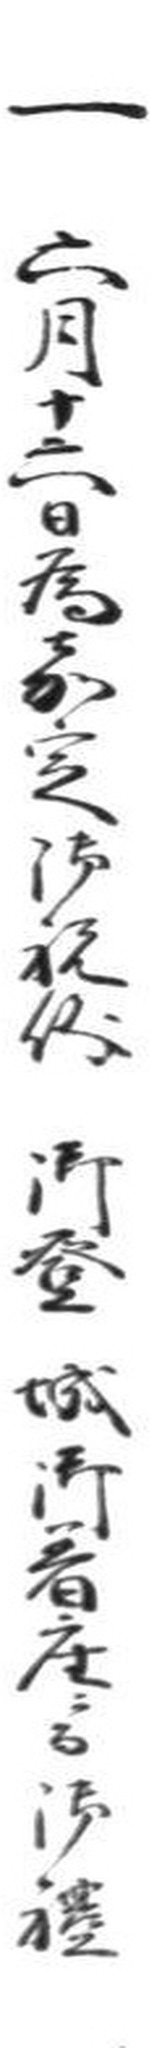一六月十二日為嘉定御祝儀御登城御着座ニ而御礼
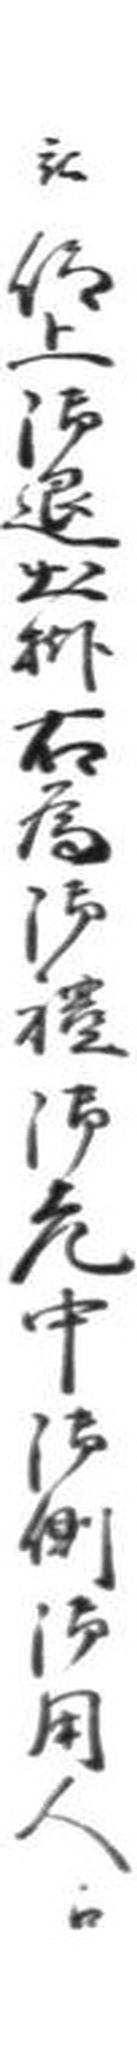被仰上御退出掛右為御礼御老中御側御用人江
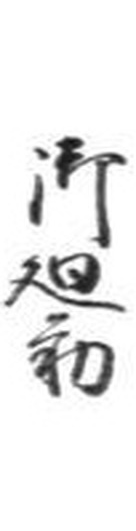御廻勤
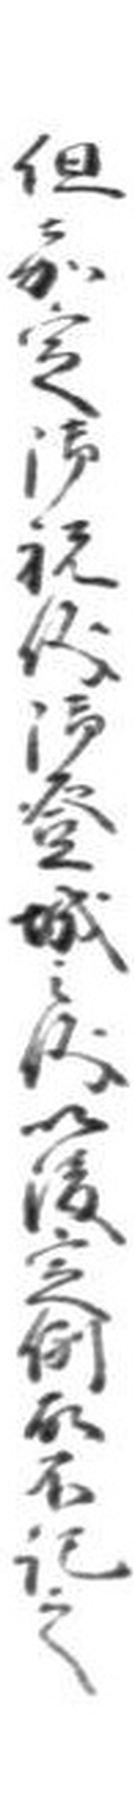但嘉定御祝儀御登城之儀以後定例故不記之
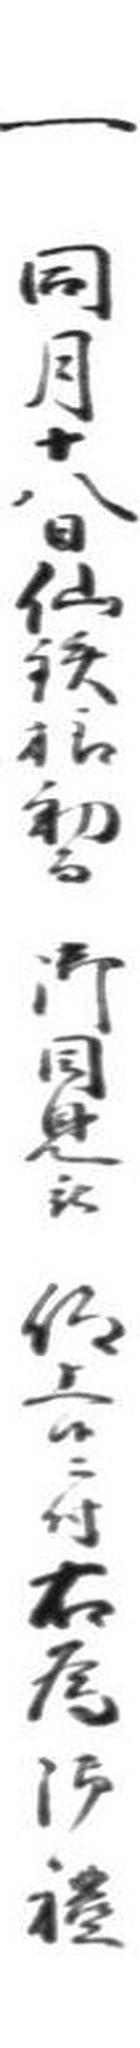一同月十八日仙鉄様初而御目見被仰上候ニ付右為御礼
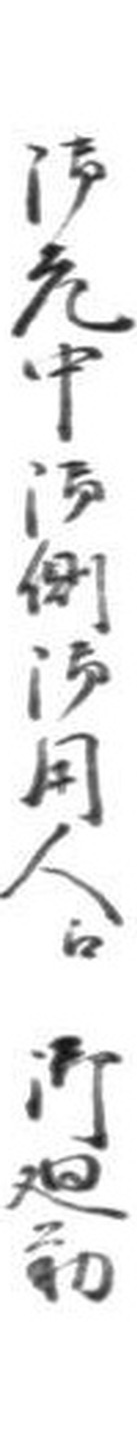御老中御側御用人江御廻勤
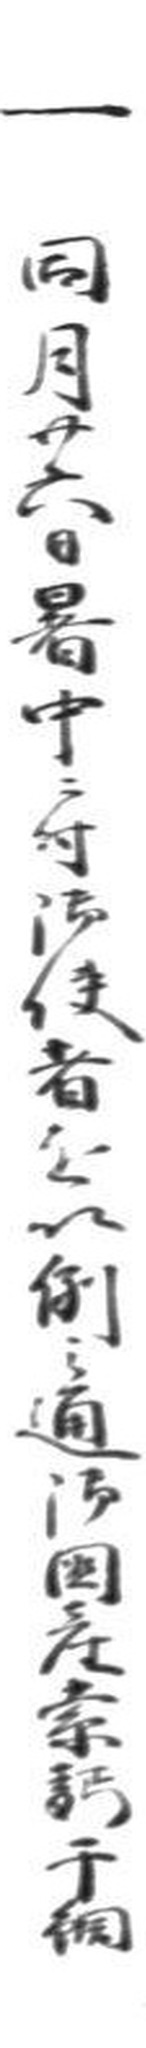一同月廿六日暑中ニ付御使者を以例之通御国産索麪干鯛
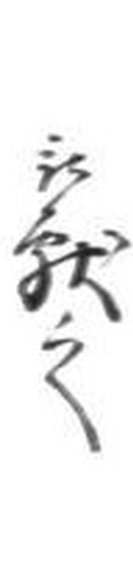被献之

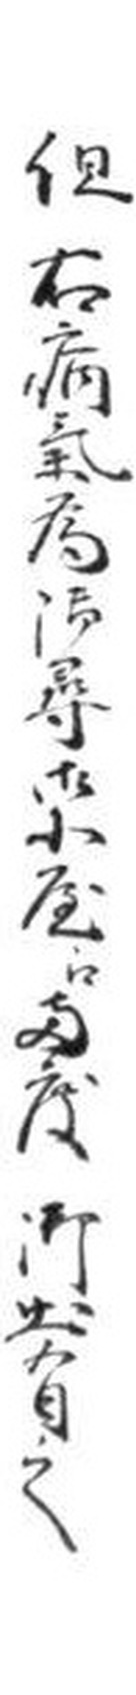但右病気為御尋御小屋江両度御出有之
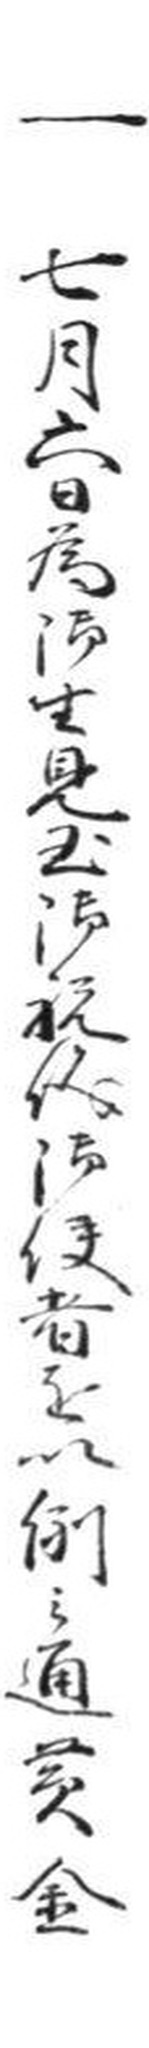一七月六日為生見玉御祝儀御使者を以例之通黄金
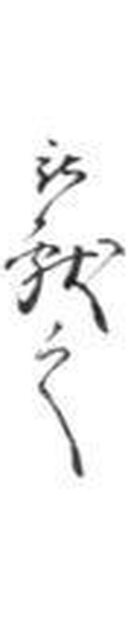被献之
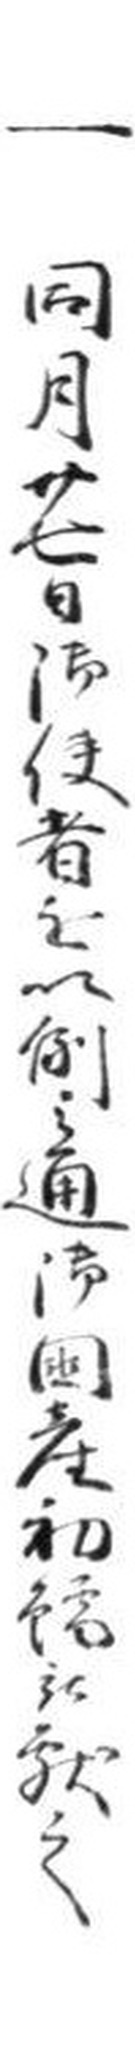一同月廿七日御使者を以例之通御国産初鱈被献之
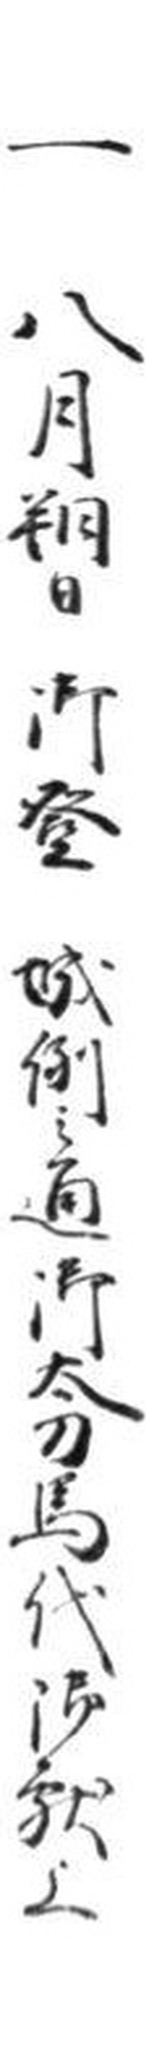一八月朔日御登城例之通御太刀馬代御献上
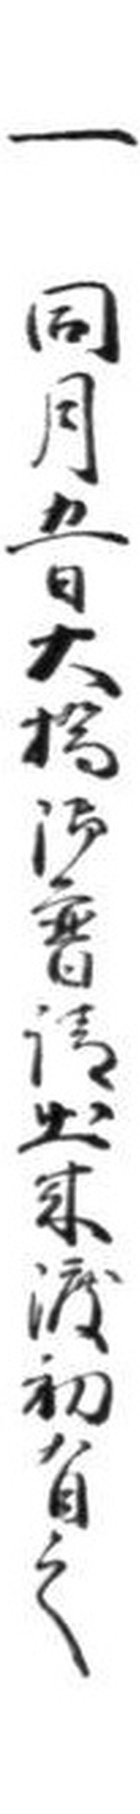一同月五日大橋御普請出来渡初有之
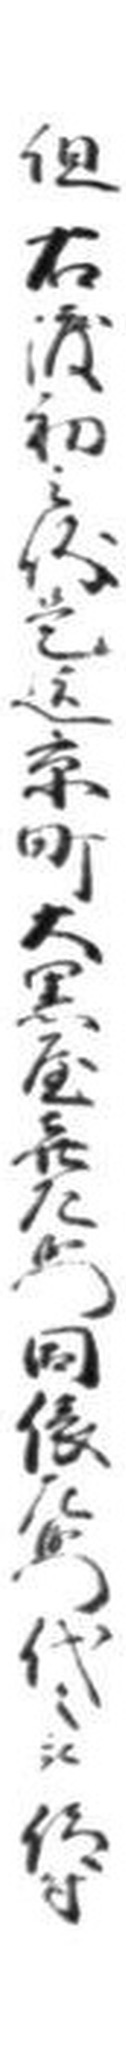但右渡初之儀是迄京町大黒屋長左衛門同俵左衛門代々被仰付
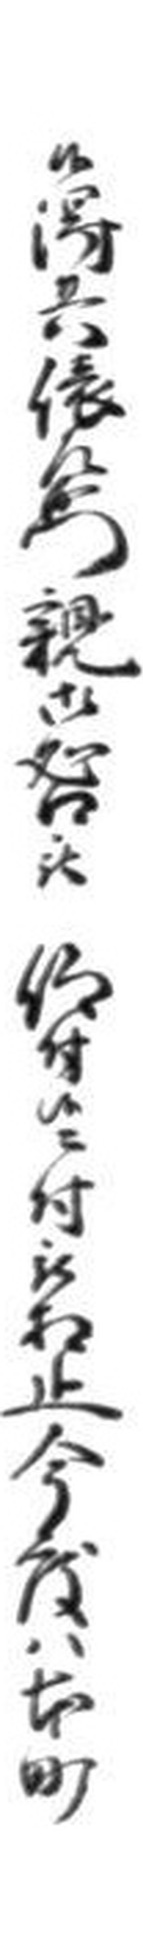候得共俵左衛門親御咎被仰付候ニ付被相止今度ハ本町
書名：家譜 十七 吉品公 従元禄元年到同二年
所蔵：福井県文書館 Fukui Prefectural Archives
